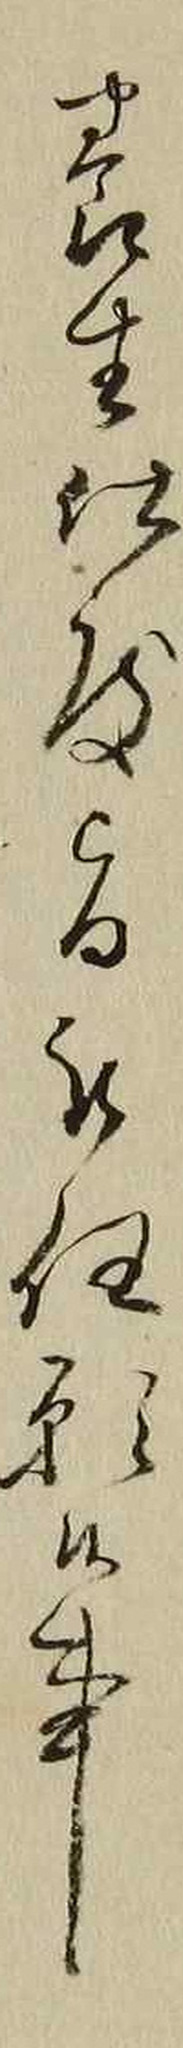養生仕度旨被任願候事
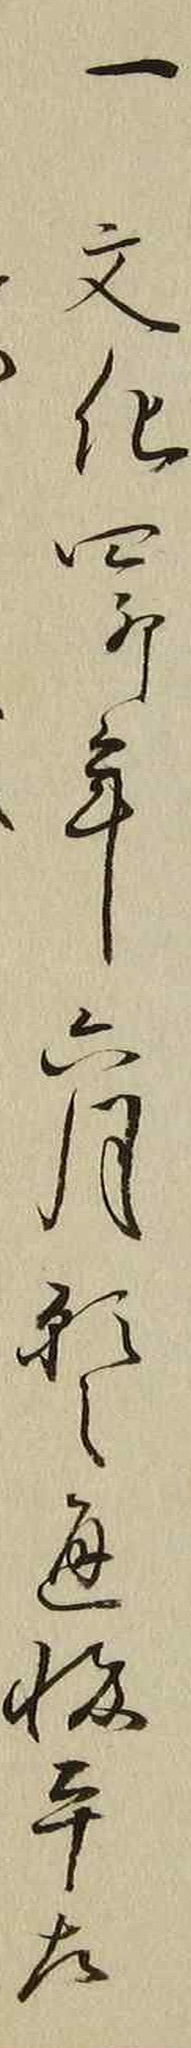一文化四卯年六月願の通悴平左
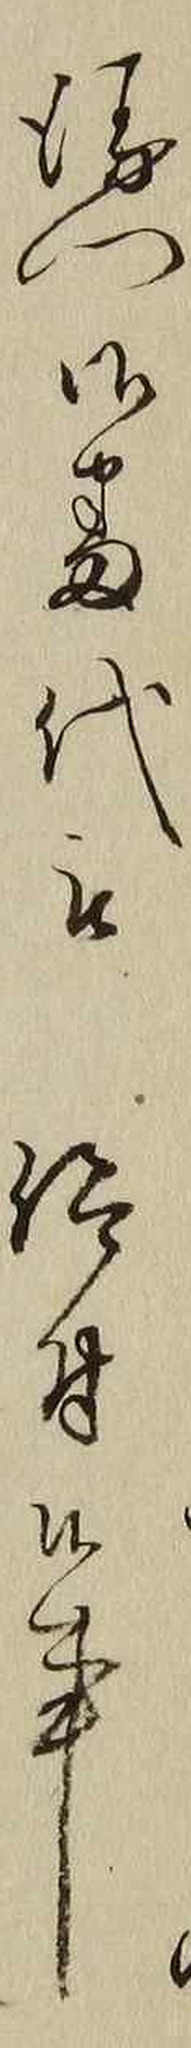衛門御番代被仰付候事
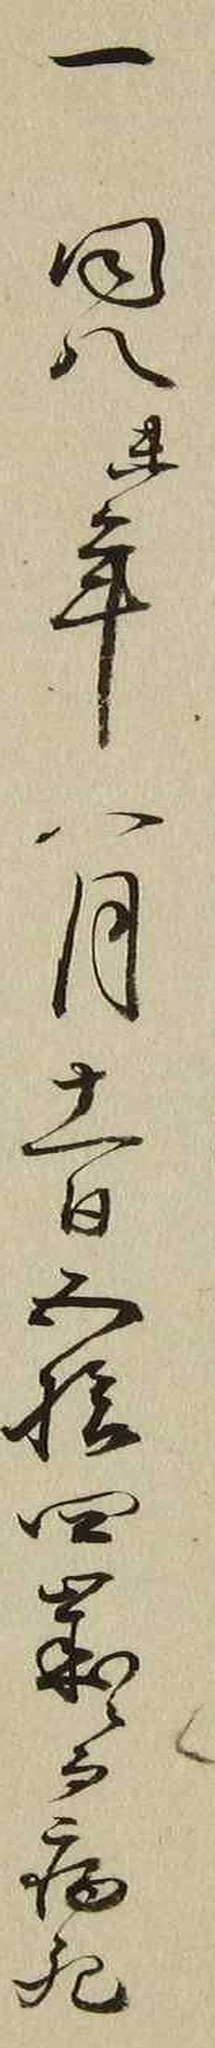一同八未年八月十一日五拾四歳に而病死
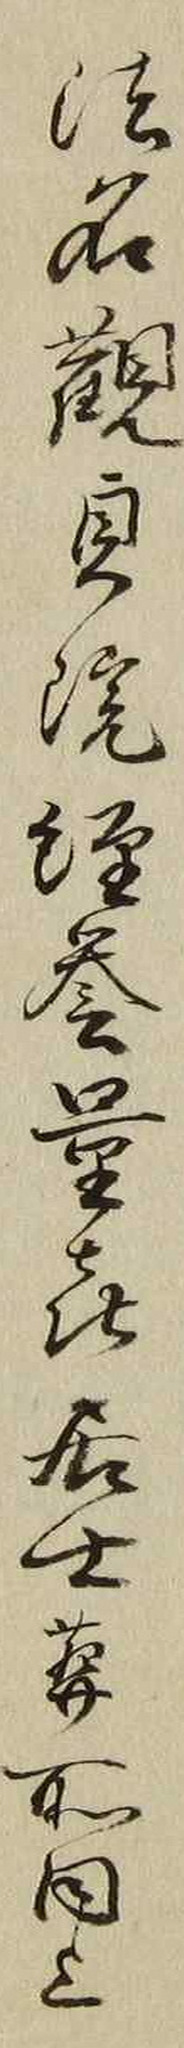法名観貞院経誉量喜居士葬所同上
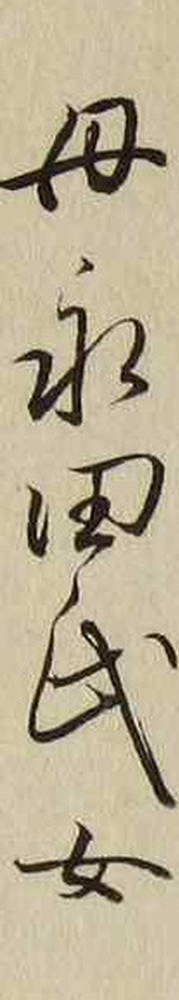母永田氏女

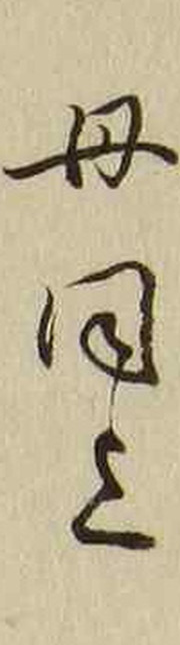母同上
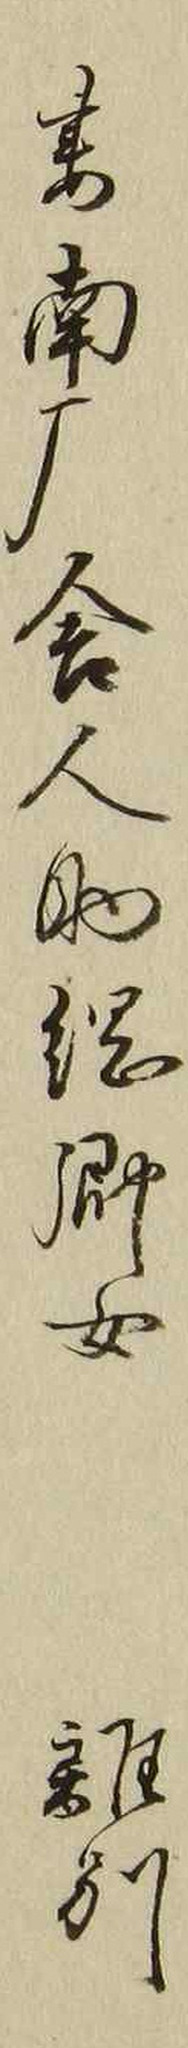妻南摩舎人助綱郷女離別
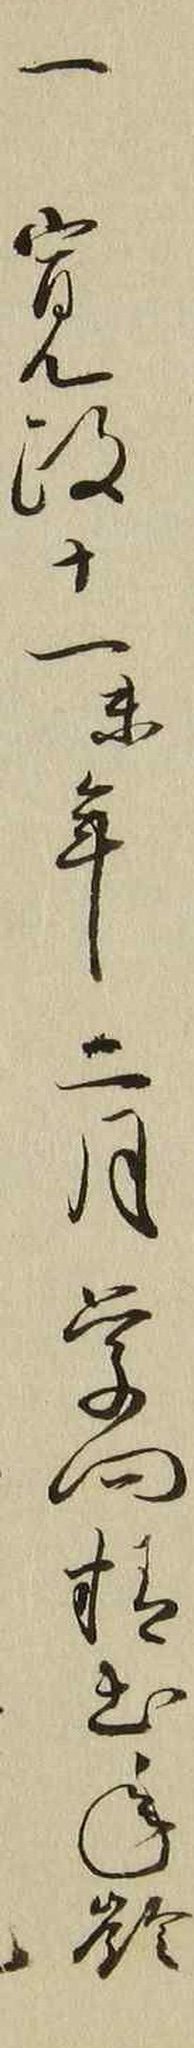一寛政十一未年二月学問精出年齢
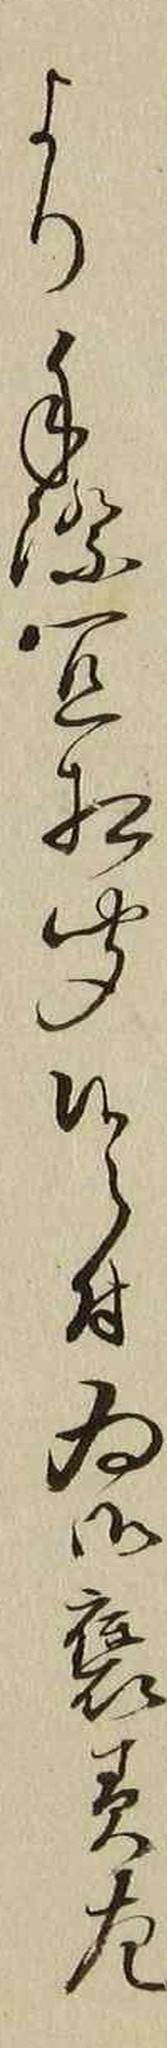より手際宜相聞候に付為御褒美左
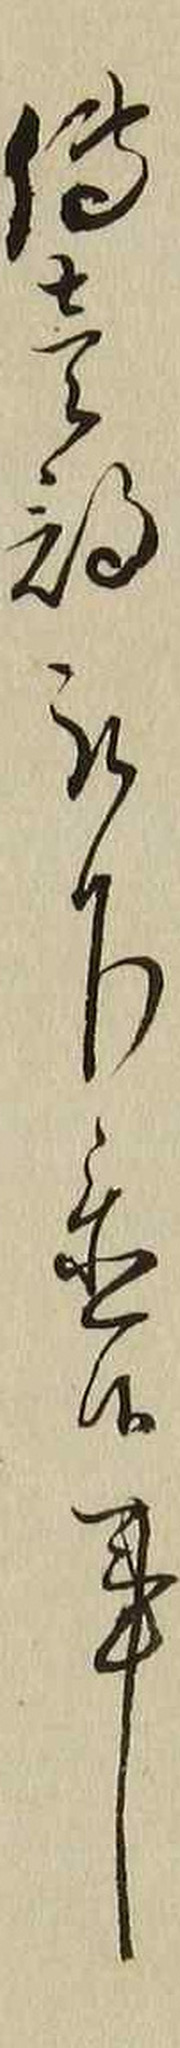伝壱部被下置候事
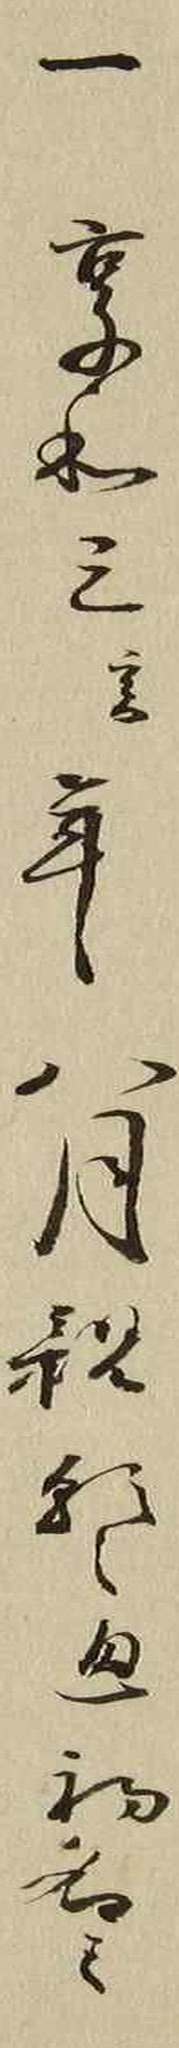一享和三亥年八月親願の通初名の
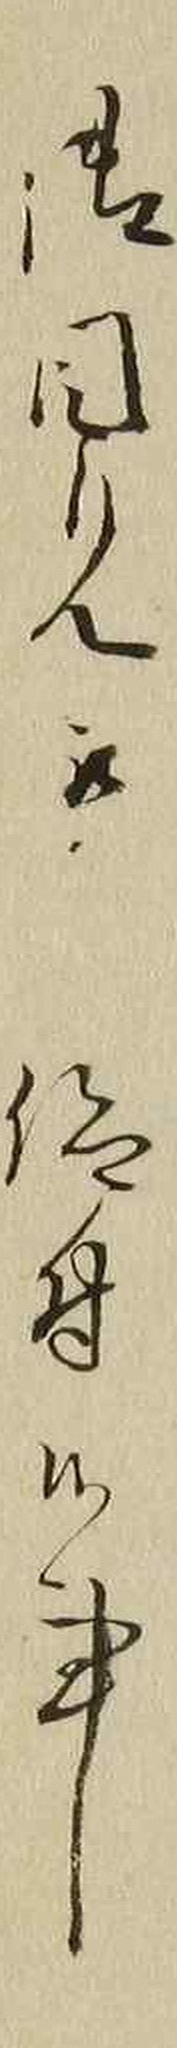御目見被仰付候事
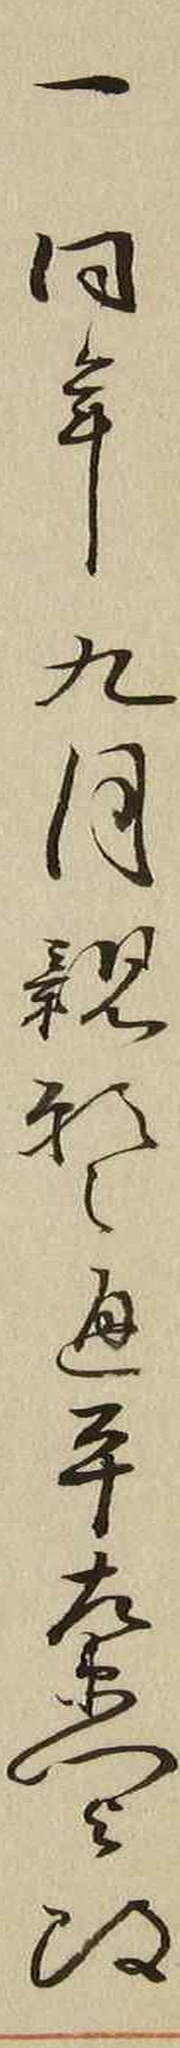一同年九月親願の通平左衛門と改
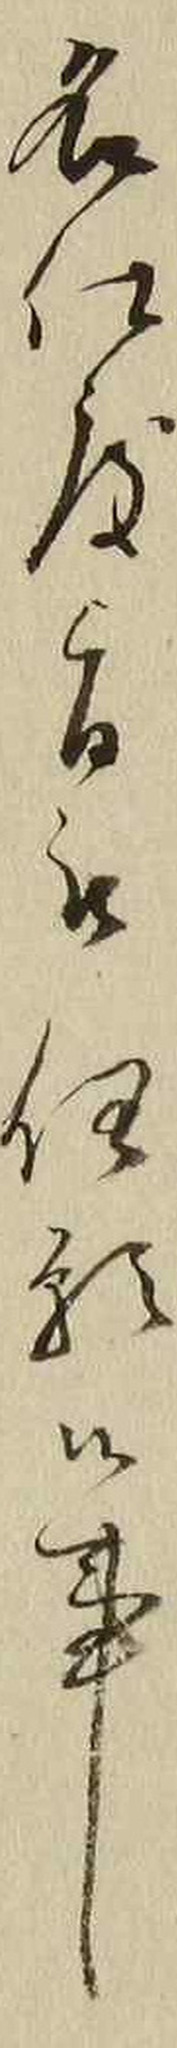名仕度旨被任願候事
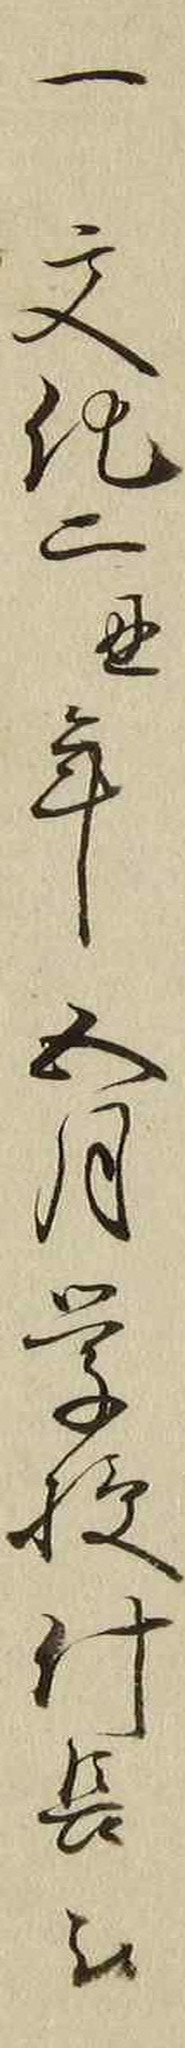一文化二丑年五月学授什長被
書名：諸士系譜　巻之1　い之部1
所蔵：会津若松市立会津図書館
